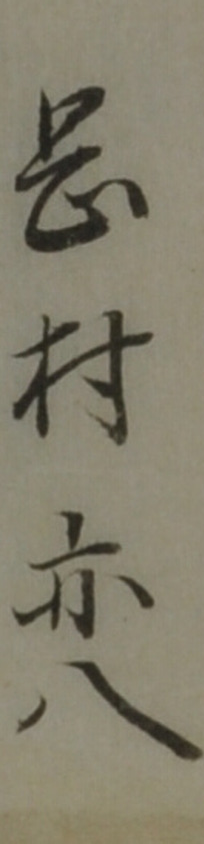岡村亦八
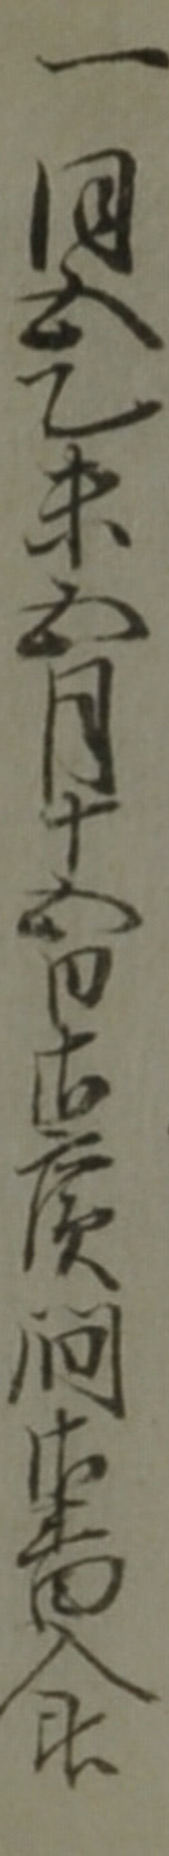一同五乙未五月十五日御広間御番入被
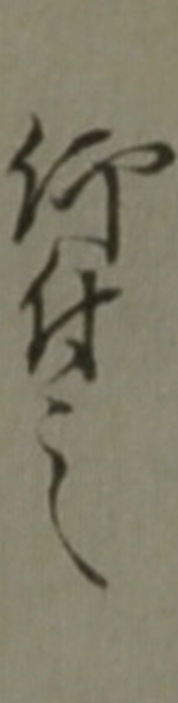仰付之
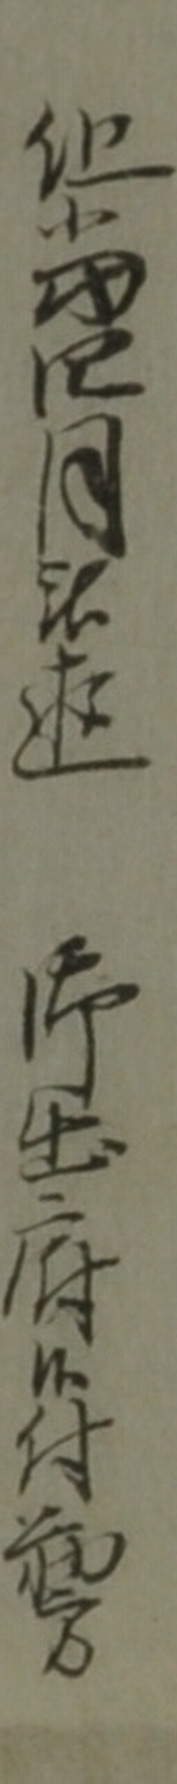但当四月被遊御在府候付勤方
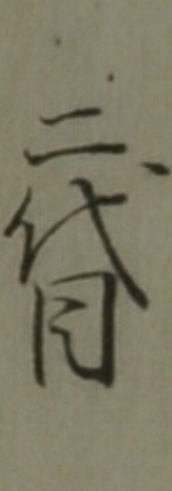二代目
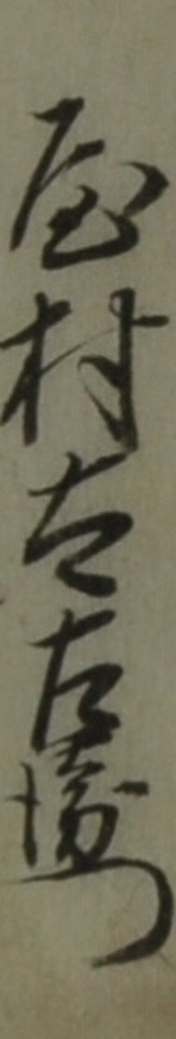屋村太左衛門
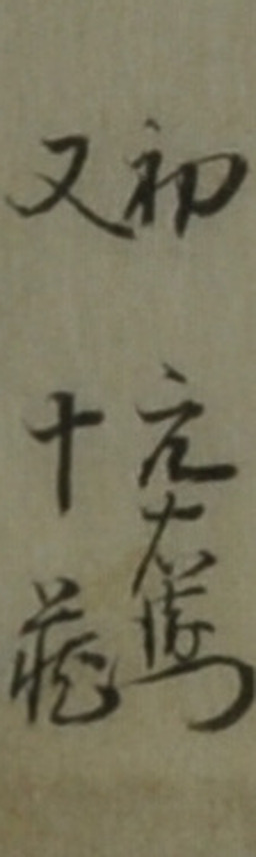又十蔵
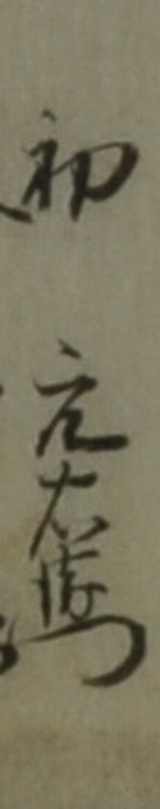初元右衛門
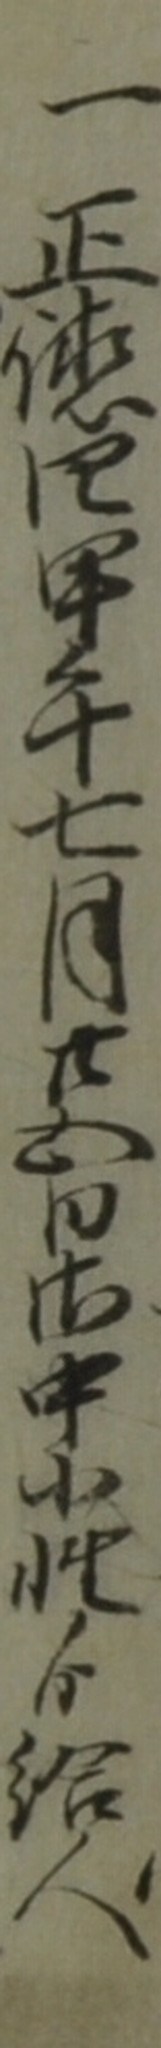一正徳四甲午七月廿五日御中小性ゟ給人
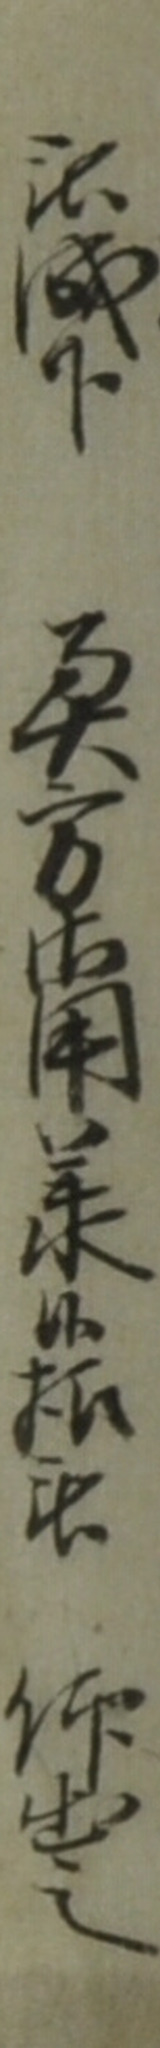被成下奥方御用承候様被仰出之

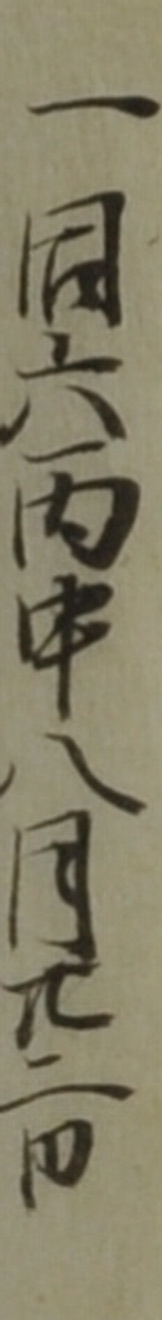一同六丙申八月廿二日
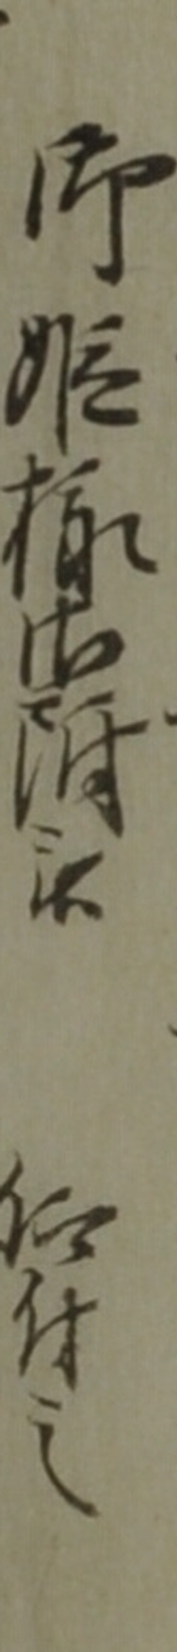御姫様御附被仰付之
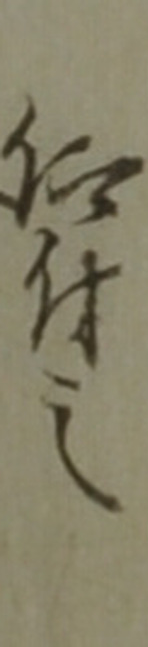仰付之
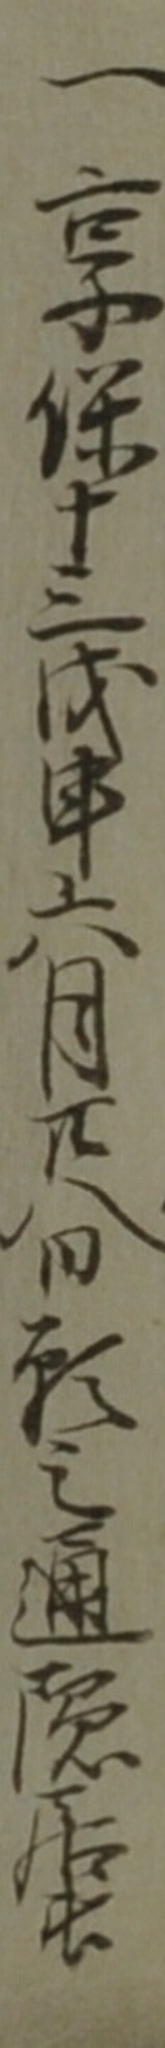一享保十三戊申六月廿八日願之通隠居被
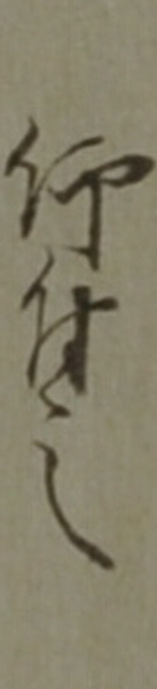仰付之
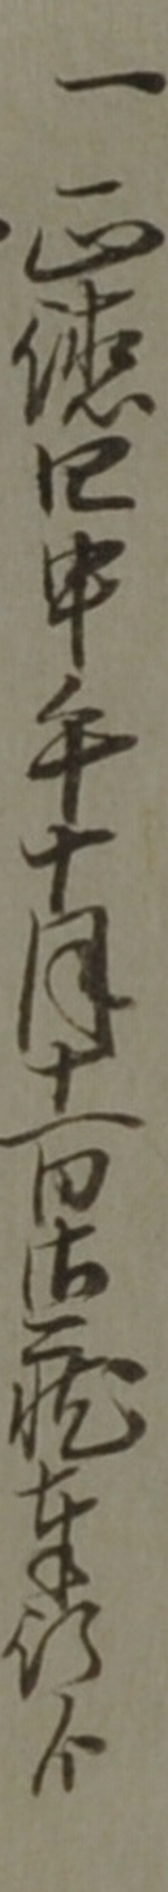一正徳四甲午十月十一日御蔵奉行ゟ
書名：諸御役代々録（六）
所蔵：伊那市立高遠町図書館・合同会社AMANE
